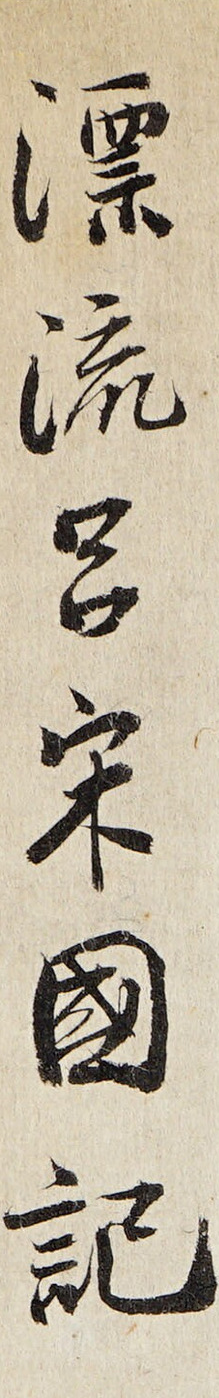漂流呂宋国記

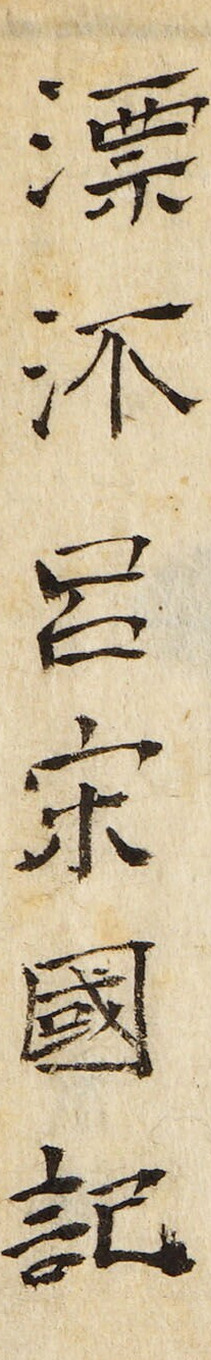漂流呂宋国記

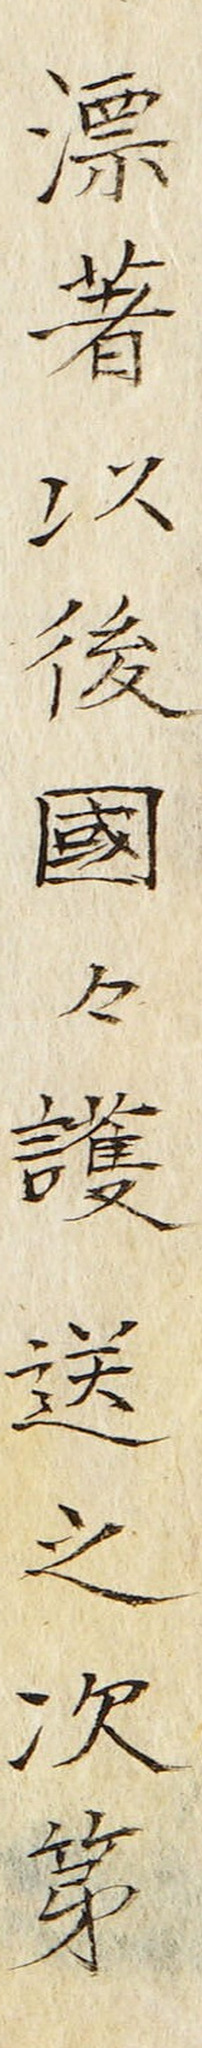漂着以後国々護送之次第
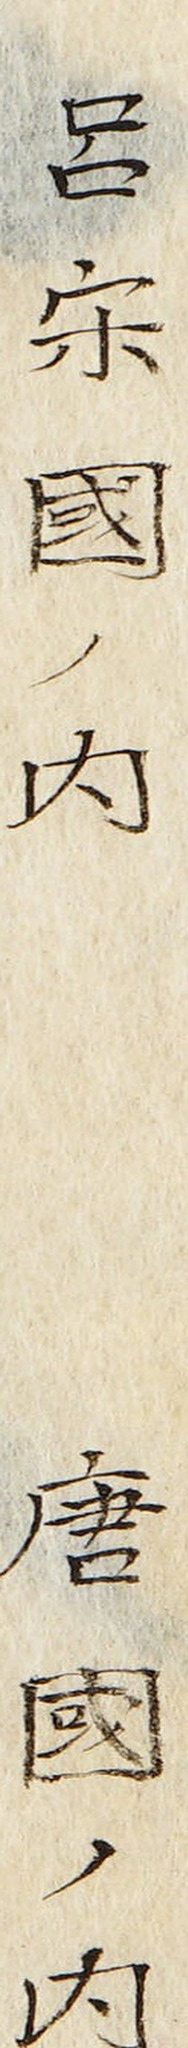呂宋国ノ内唐国ノ内
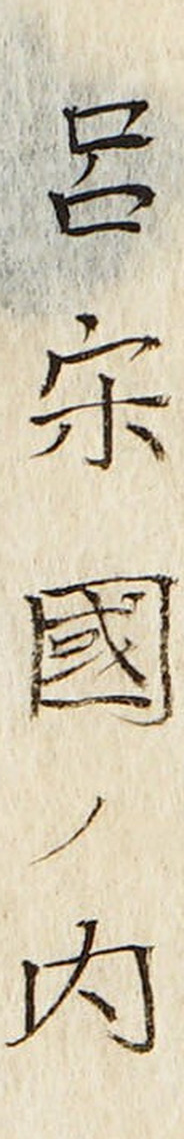呂宋国全図
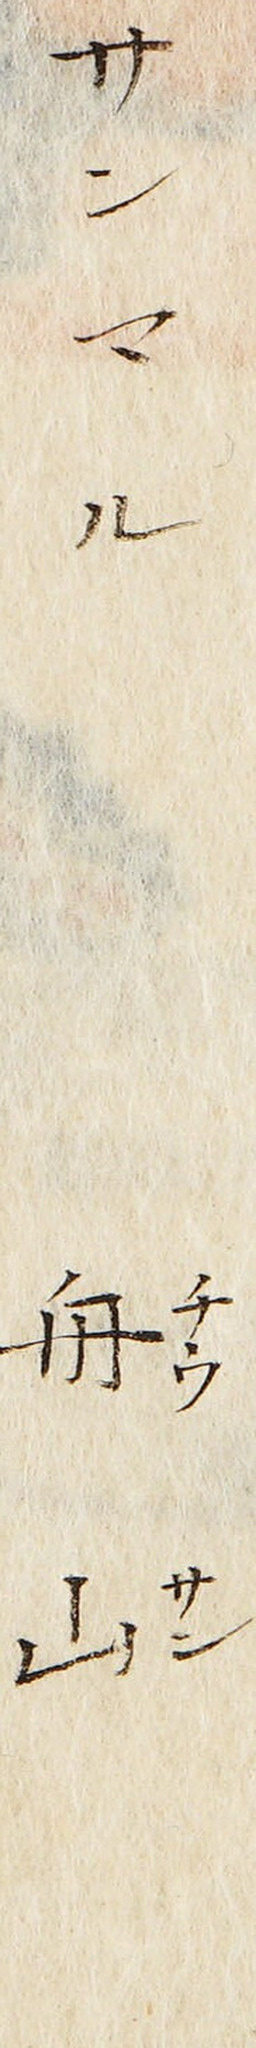サンマル舟山
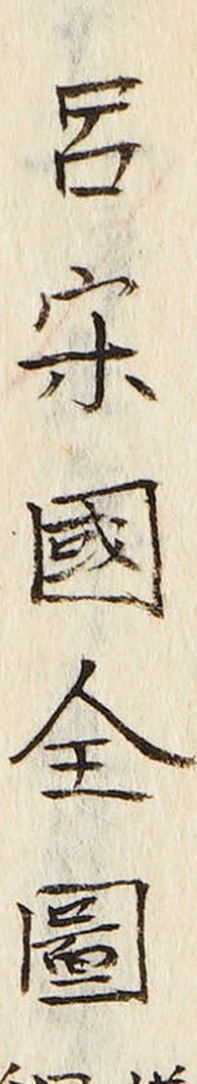呂宋国全図

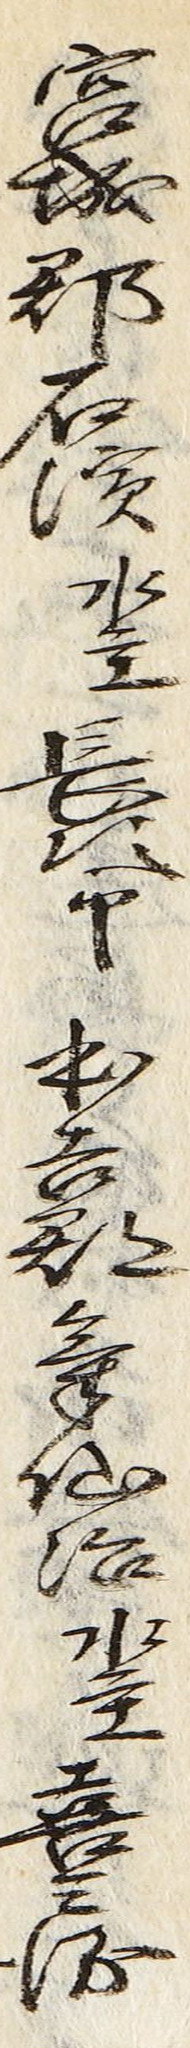宮城郡石浜水主長次郎本吉郡気仙沼水主喜兵衛
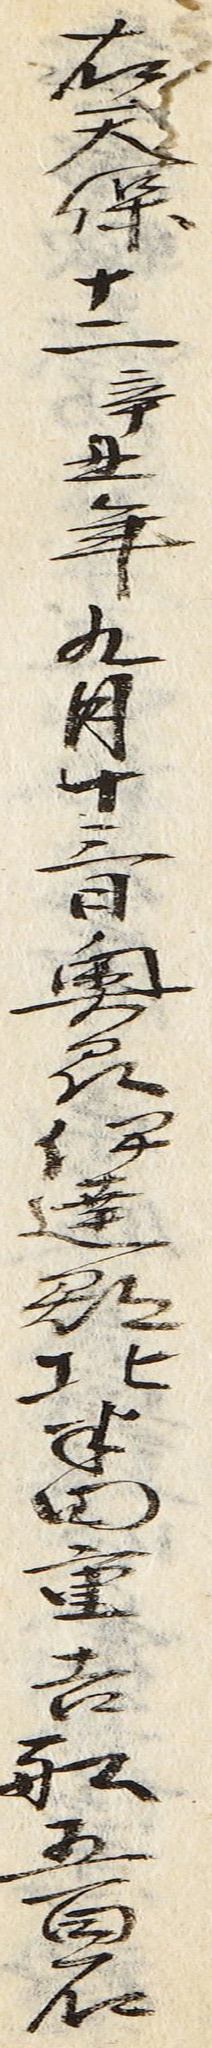右天保十二辛丑年九月十三日奥州伊達郡北半田重吉舟五百石
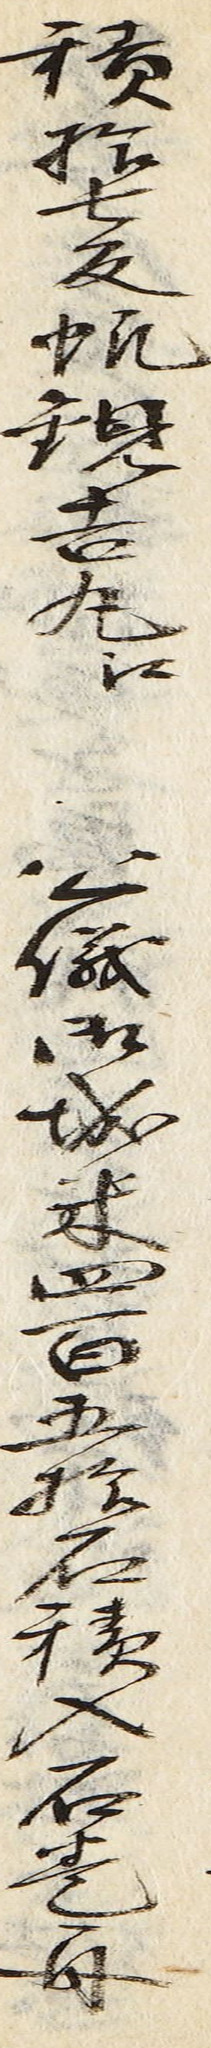積拾七反帆観吉丸江公儀御城米四百五拾石積入石巻舟
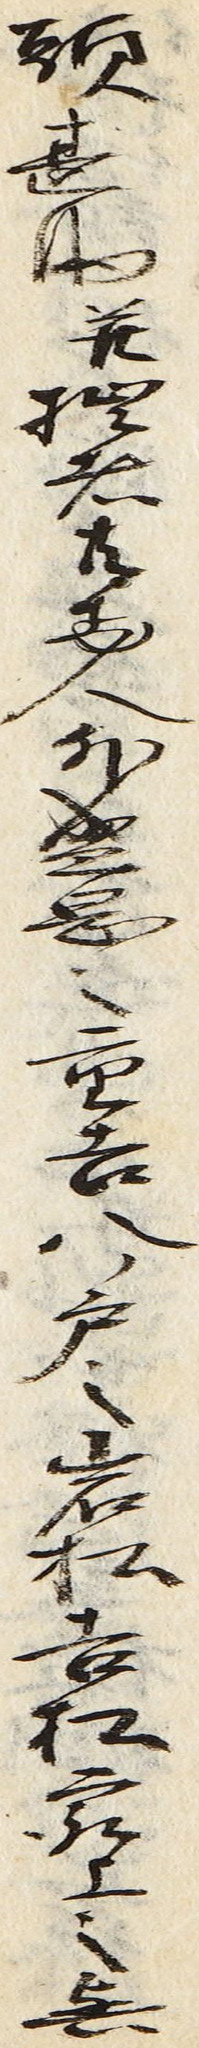頭甚助并拙者共両人外盛岡之重吉八ノ戸之岩松吉松最上之与
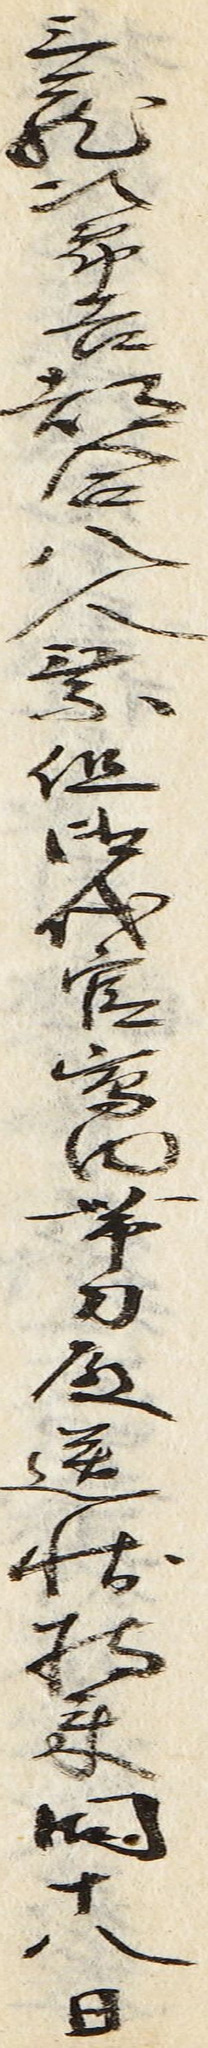三蔵次郎吉都合八人乗但御代官峰内帯刀殿送状持来同十八
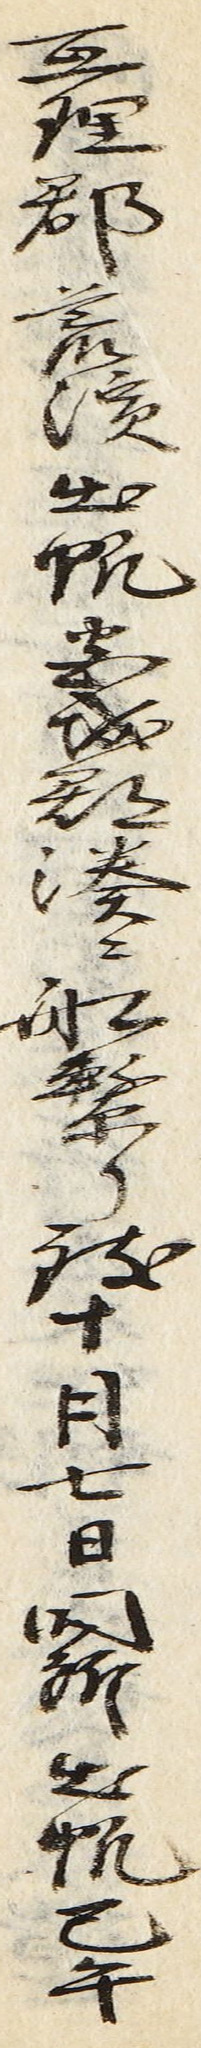亘理郡荒浜出帆宮城郡湊ニ船繋り致十月七日同所出帆巳午
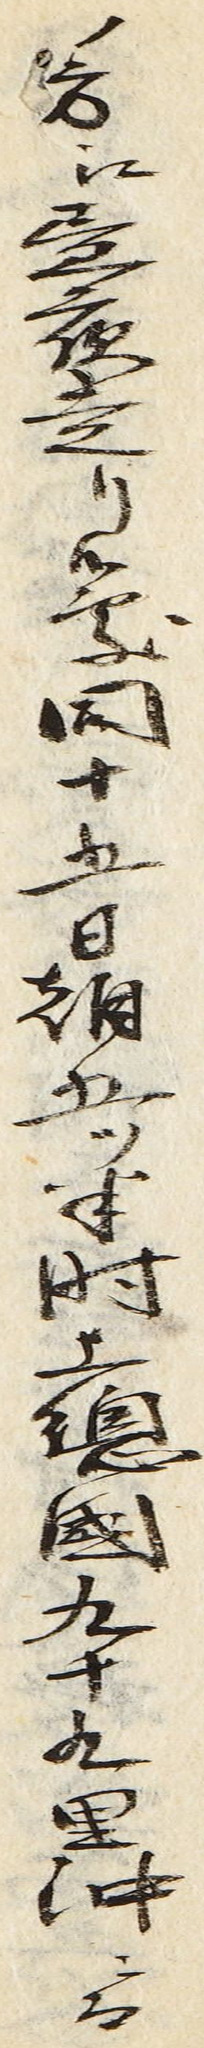ノ方江昼夜走り候処同十五日朝五ツ半時上総国九十九里沖ニ而
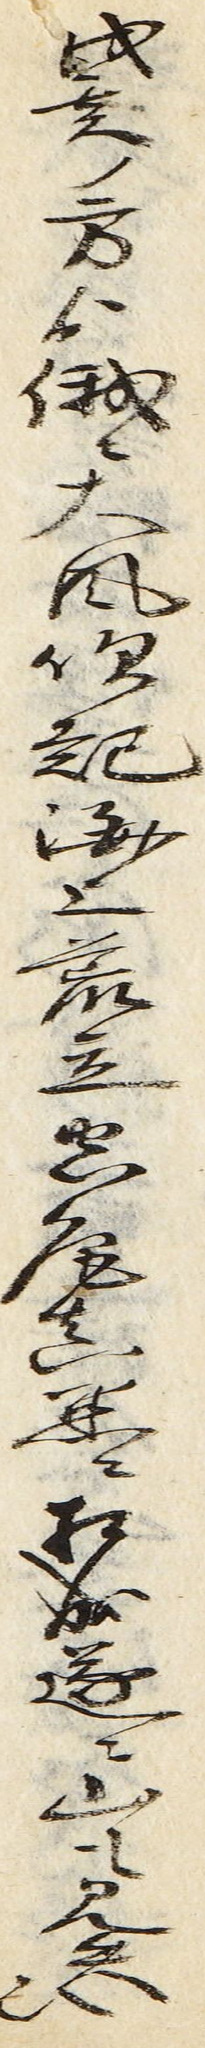戌亥ノ方ゟ俄ニ大風吹起海上荒立空危真黒ニ相成遂ニ山も見失ひ
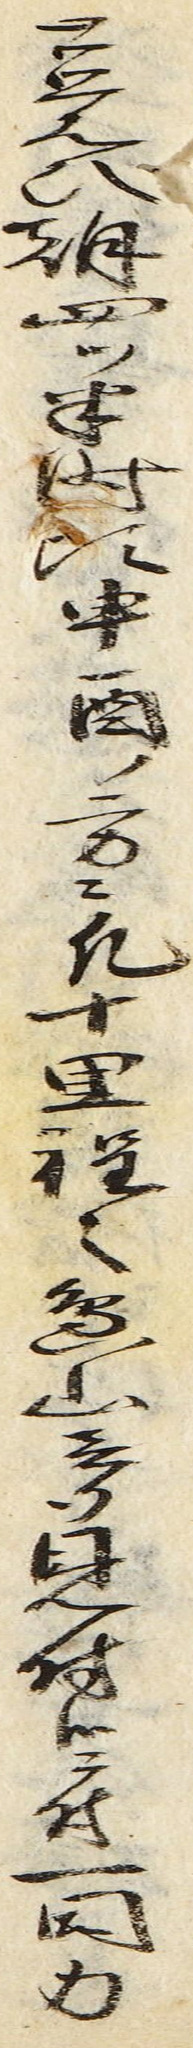と覚式朝四ツ半時頃申酉ノ方ニ凡十里程之辺山壱ツ見付候ニ付一同力
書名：漂流呂宋国記
